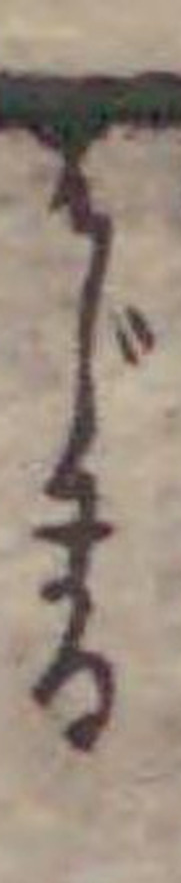はじまる
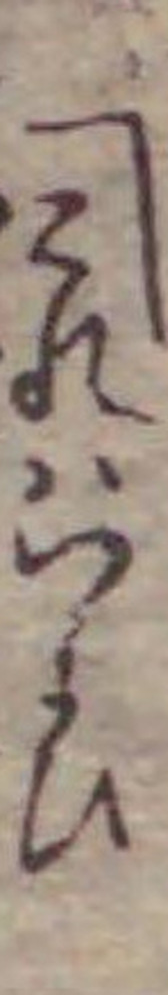〽これはつよひ
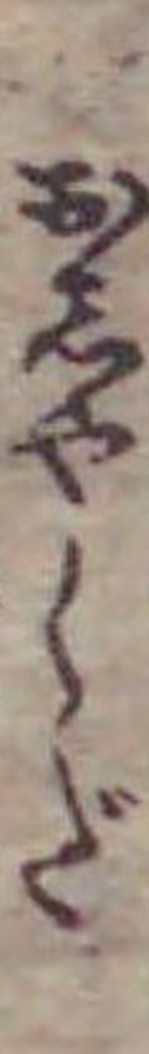おしやくだ
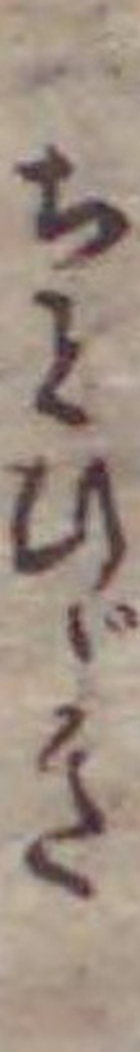ちとひゞき
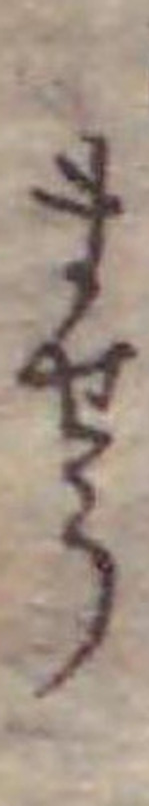ませう

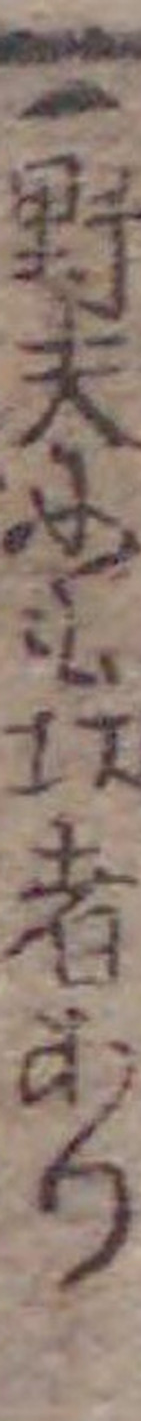▲野夫にも功者あり
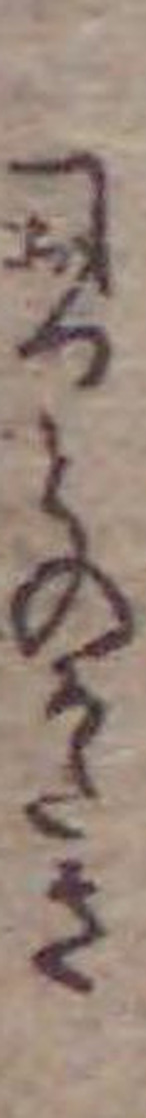〽おやのかたき
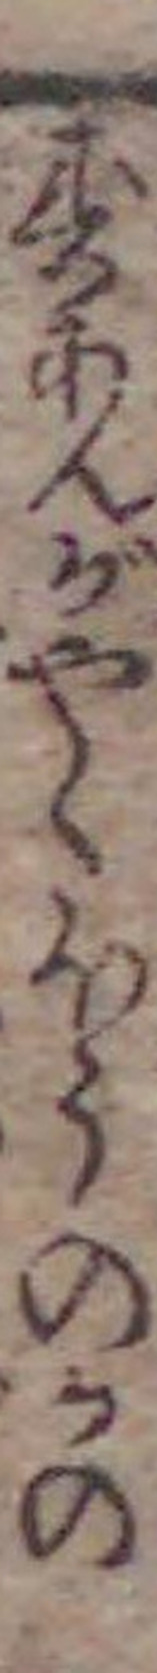寿あんがやくほうのかの
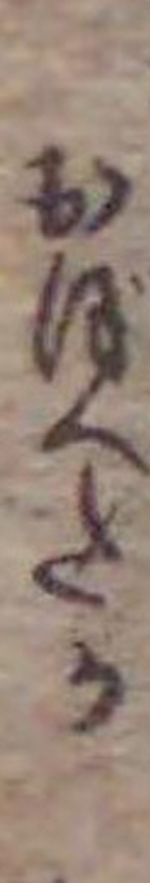おぼへたか
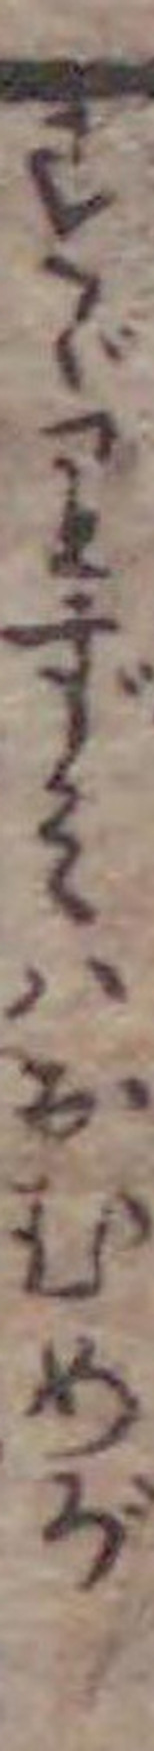すゞりずみはおむめが
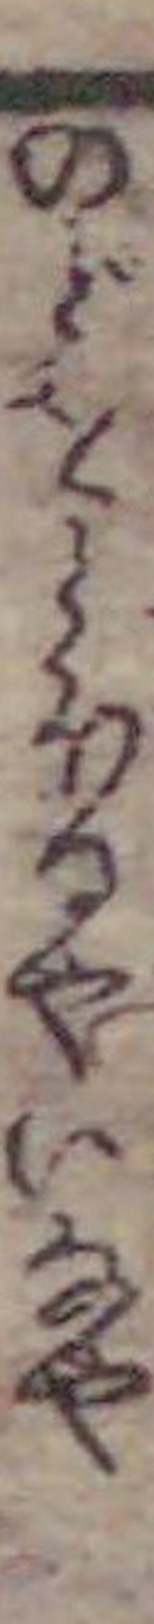のどをとほるやいな
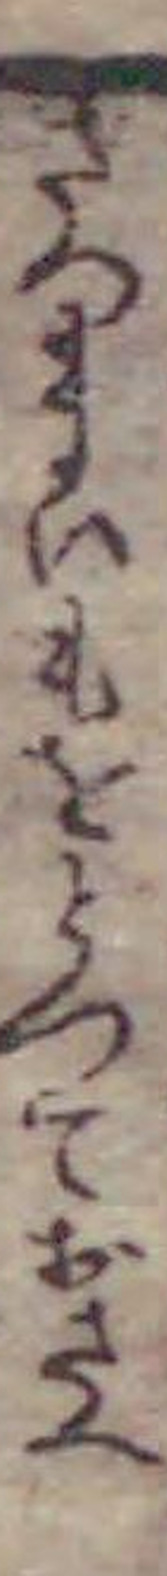やさつまいもをとつておさへ
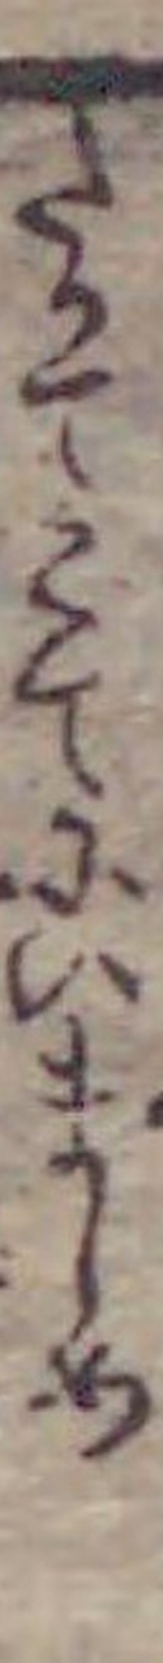たかてこてにいましめ
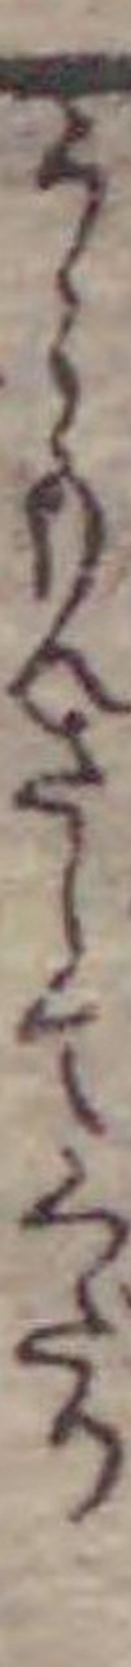うらもんさしてくだり
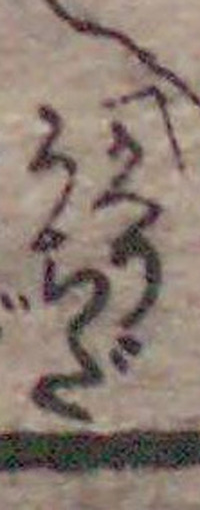うちだ
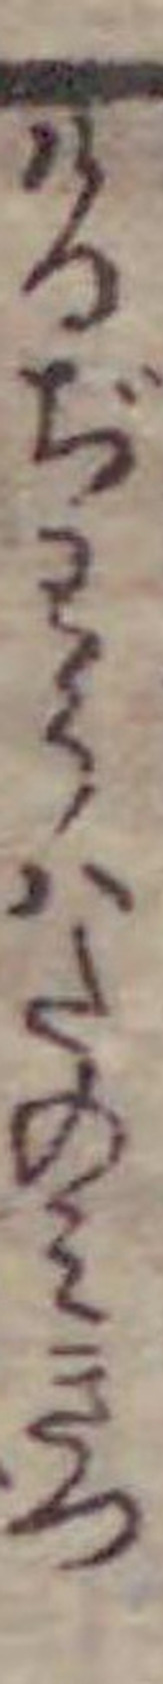けるぢわうはたのみきつ
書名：鼻下長生薬 : 3巻
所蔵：国立国会図書館 National Diet Library, JAPAN
